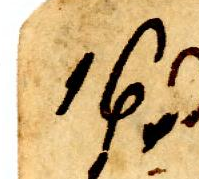16
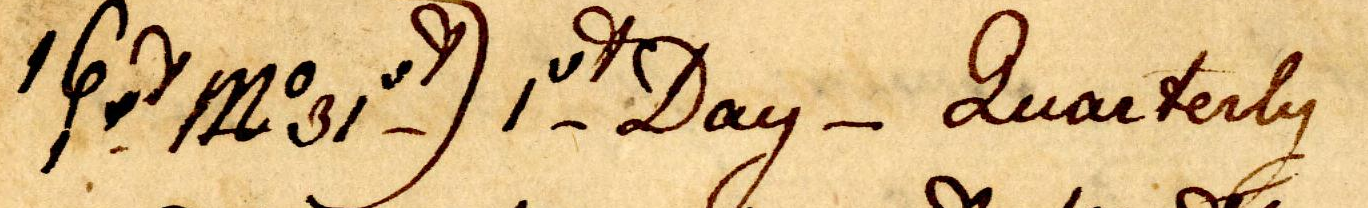1^st M^o 31^st) 1^st Day- Quarterly
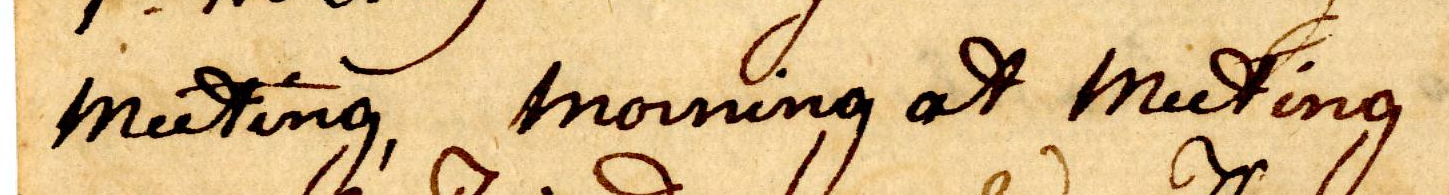Meeting, morning at Meeting
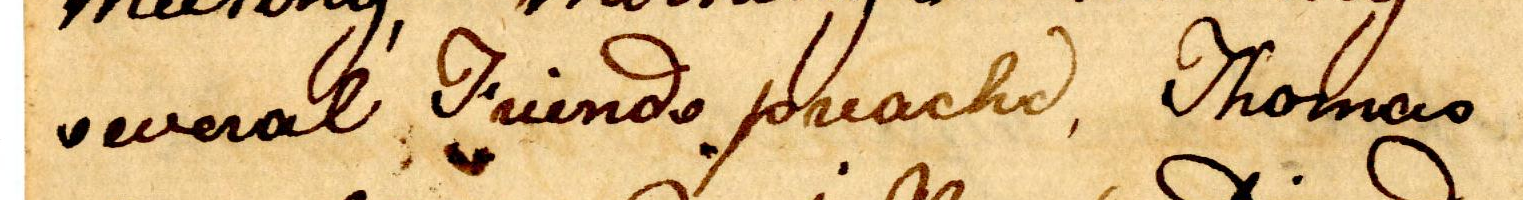several Friends preachd, Thomas
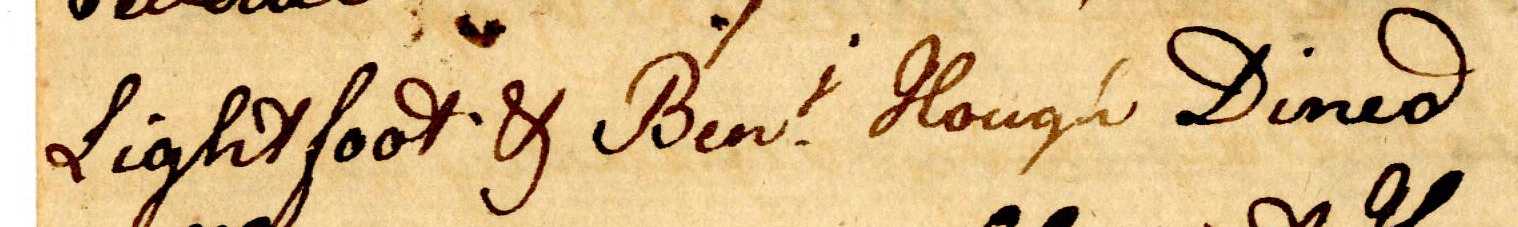Lightfoot & Ben^j Hough Dined
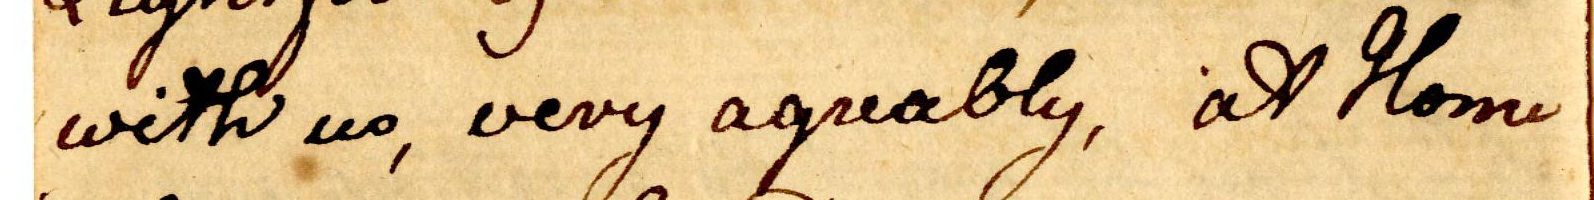with us, very agreably, at Home
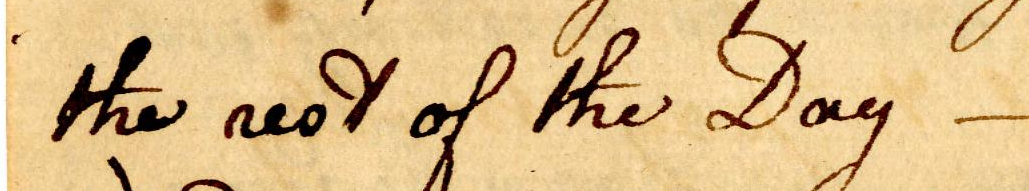the rest of the Day-
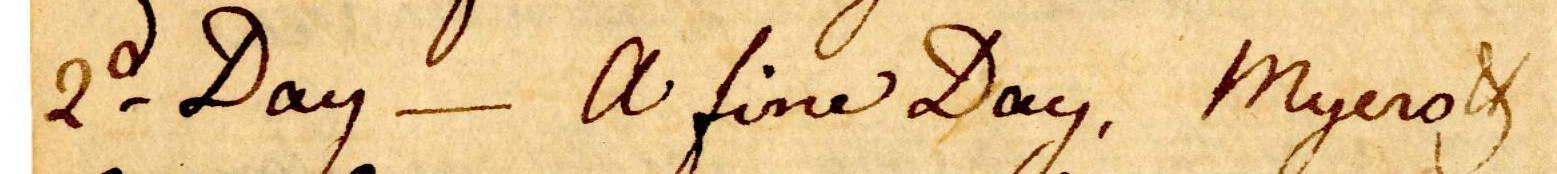2^d Day- A fine Day, Myers &
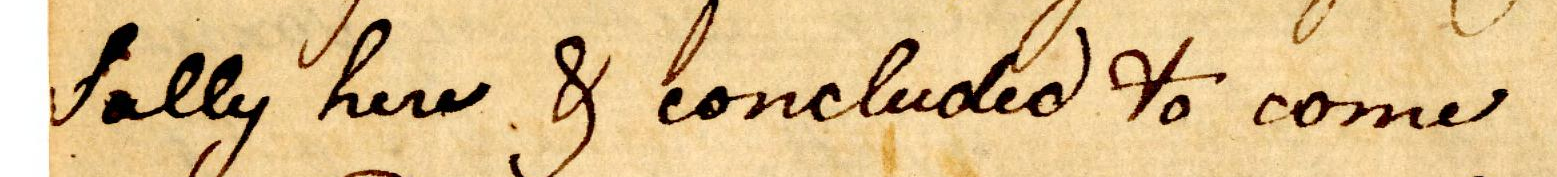Sally here & concluded to come
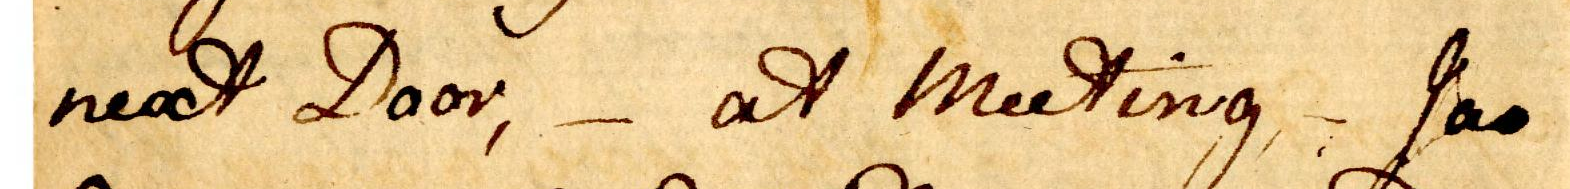next Door,- at Meeting,- Jas
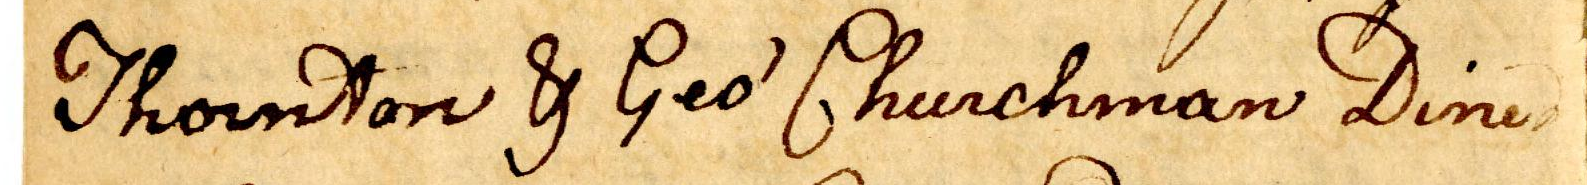Thornton & Geo' Churchman Dined
